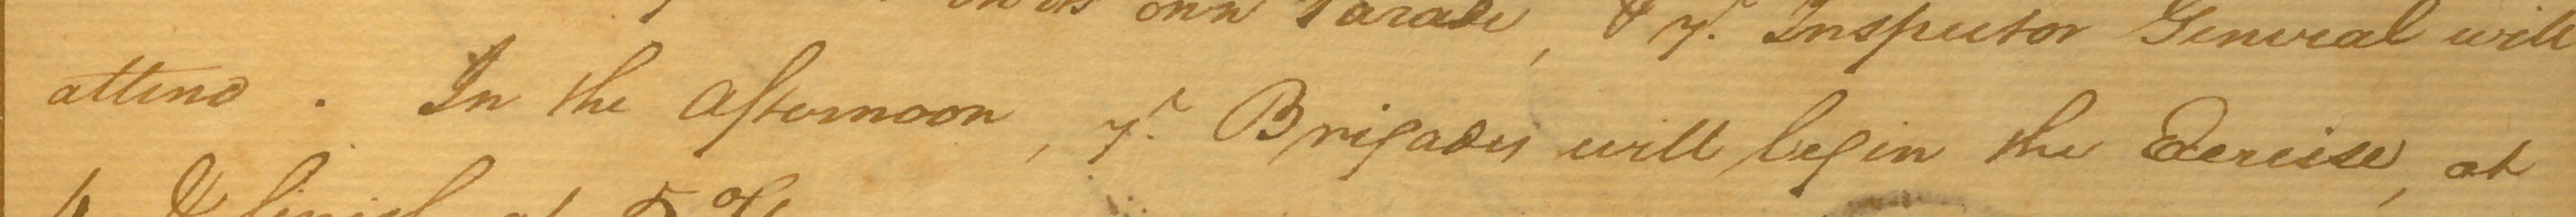attend. In the afternoon, y^e. Brigades will begin the Exercise, at
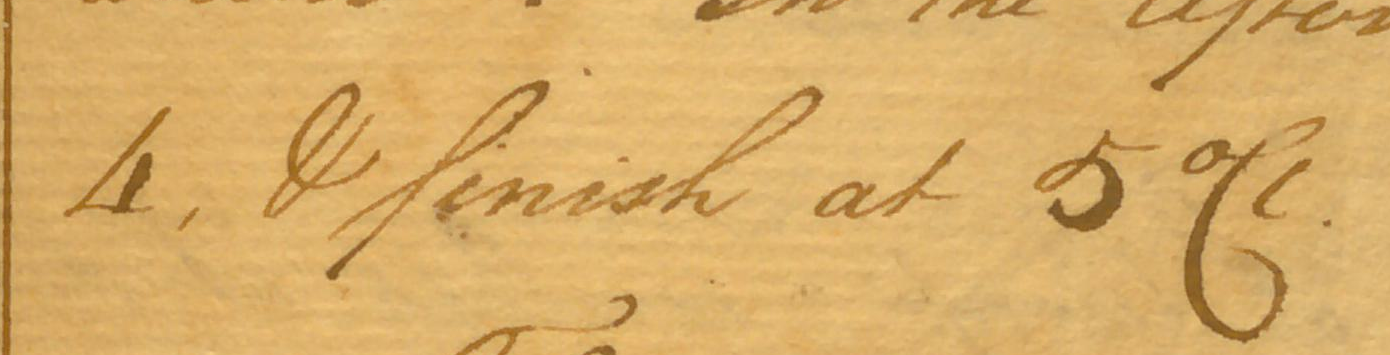4. & finish at 5 ^oCl.
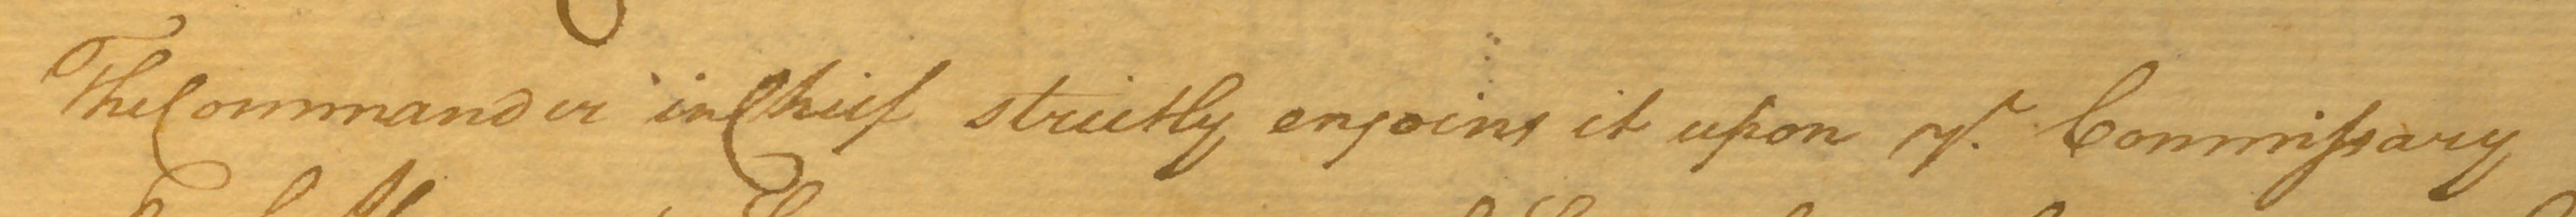The Commander in Chief strictly enjoins it upon y^e. Commissary
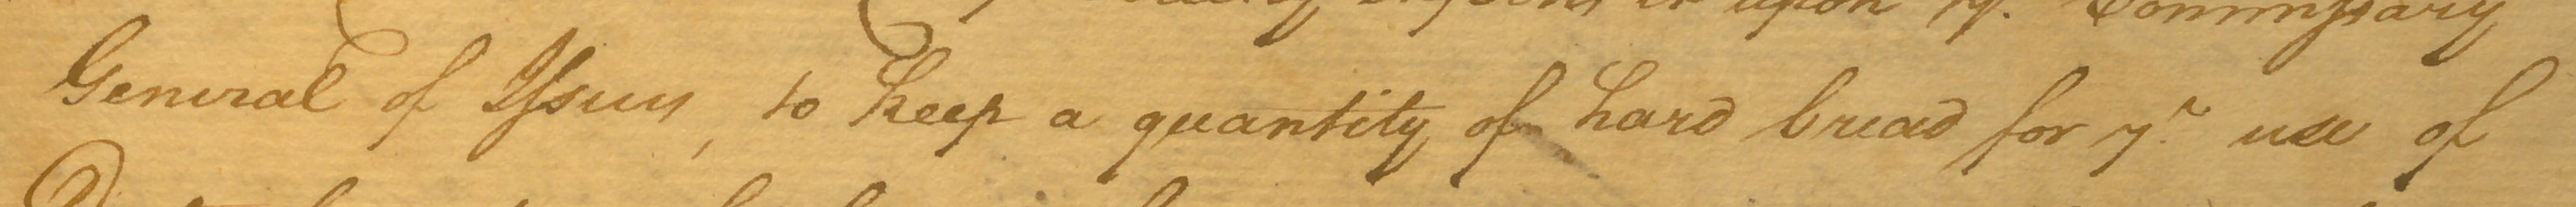General of Issues, to keep a quantity of hard bread for y^e. use of
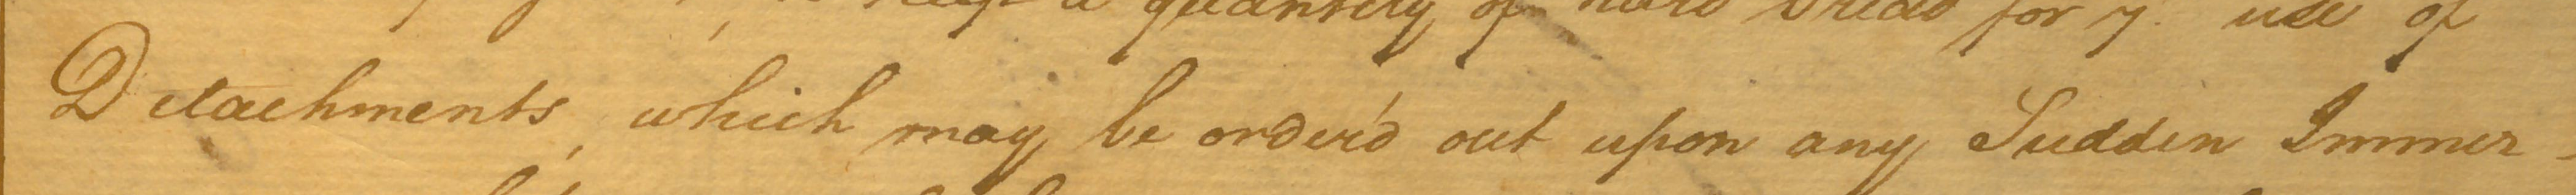Detachments, which may be order'd out upon any Sudden Immer-
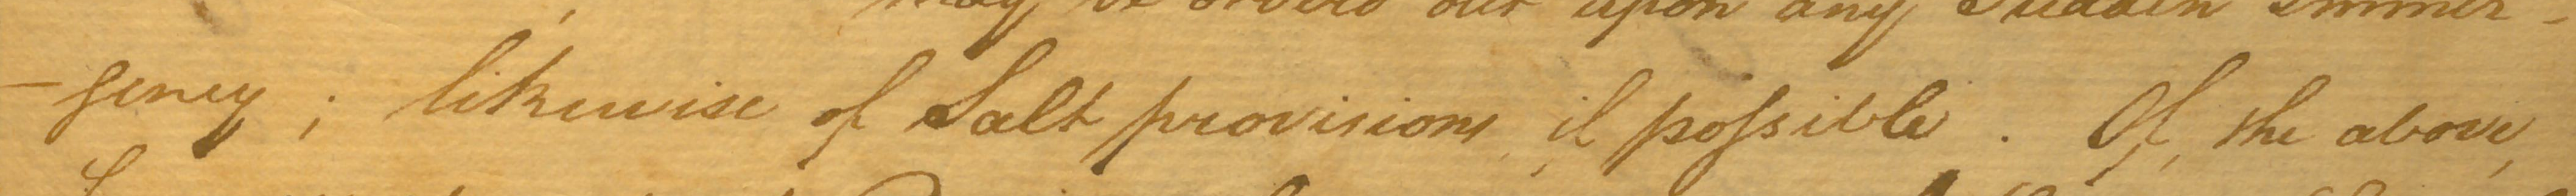-gency; likewise of Salt provisions if possible. Of the above,
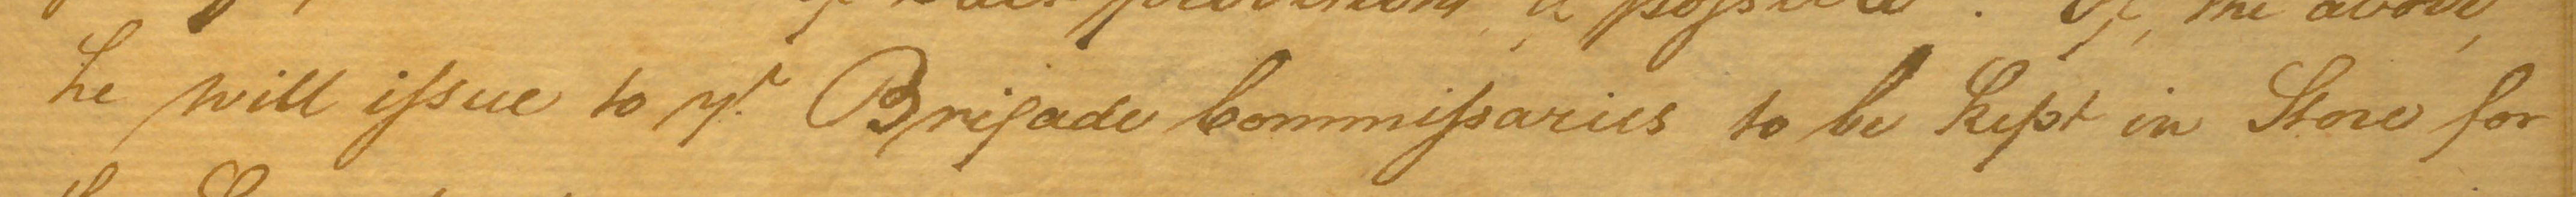he will issue to y^e. Brigade Commissaries to be kept in store for
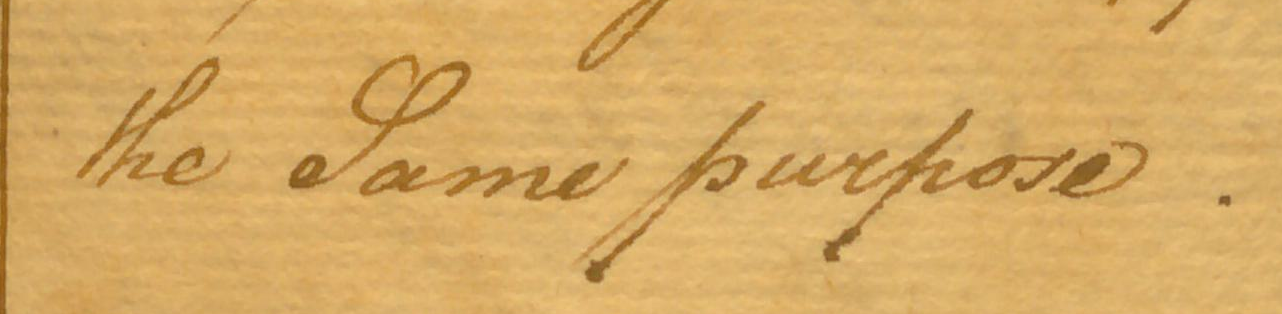the same purpose.
